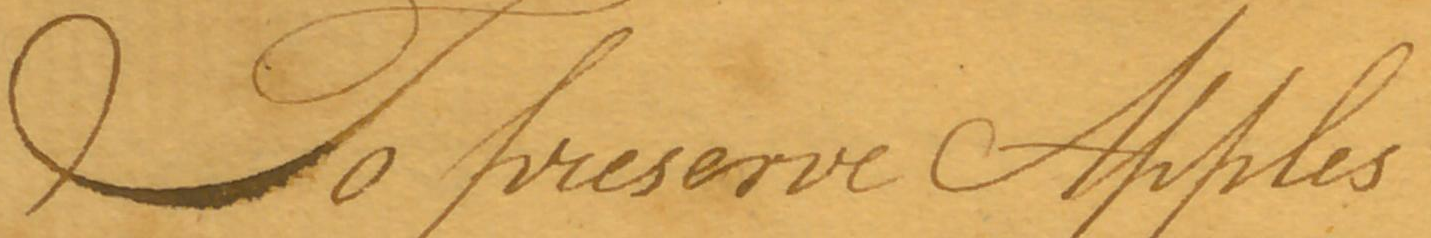To preserve Apples
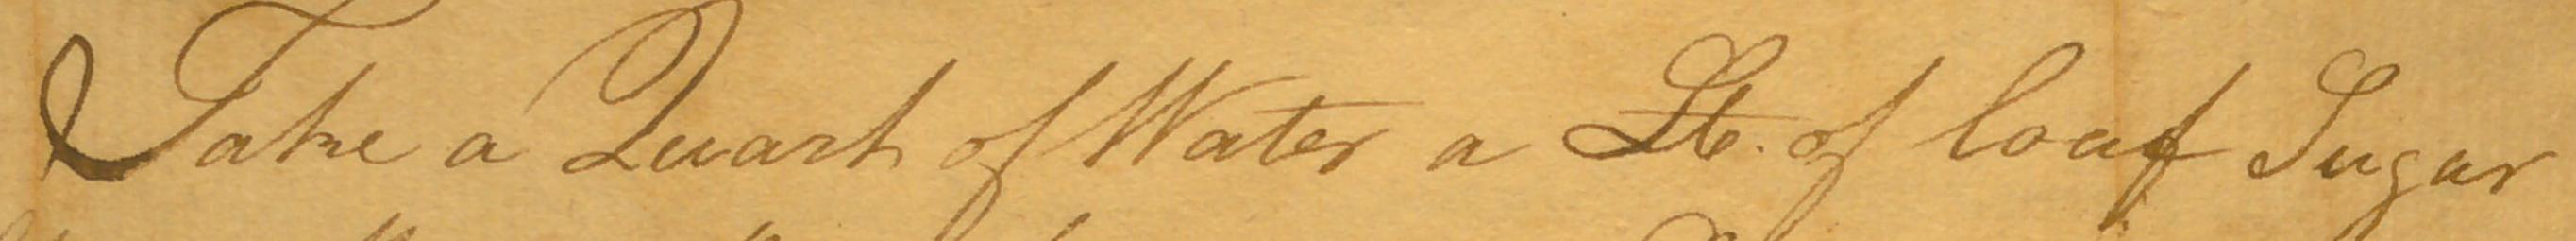Take a Quart of Water a Lb. of loaf Sugar
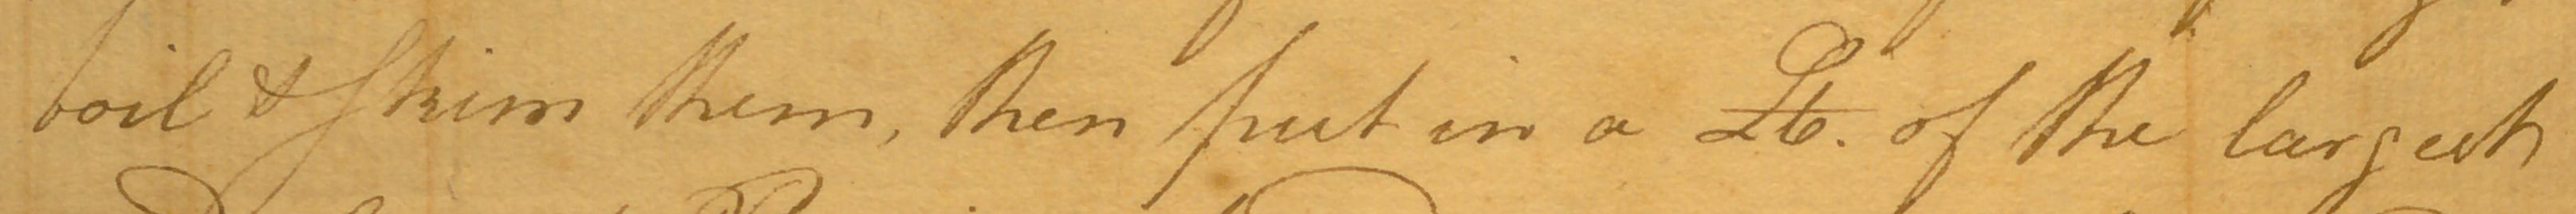boil & skim them, then put in a Lb. of the largest
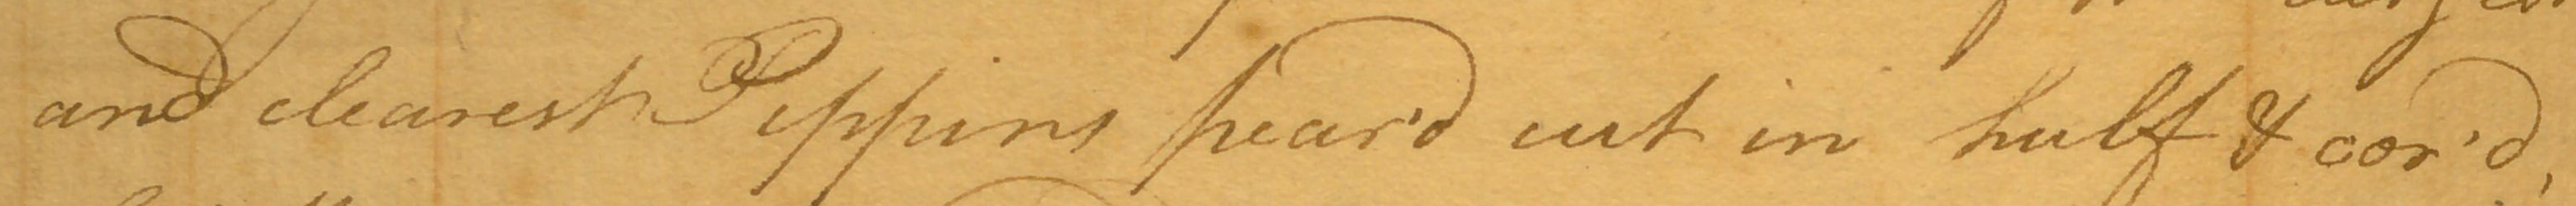and clearest Pippens pear'd cut in half & cor'd
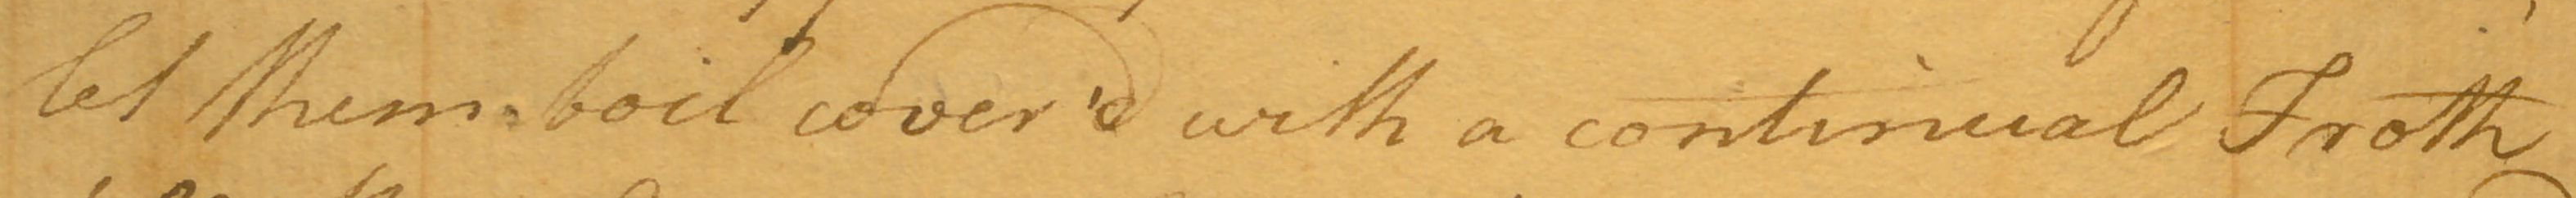let them boil cover'd with a continual Froth
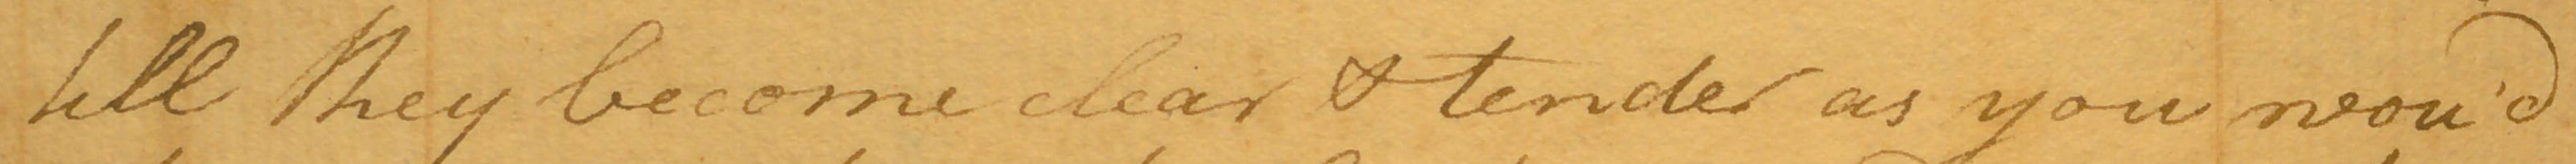till they become clear & tender as you wou'd
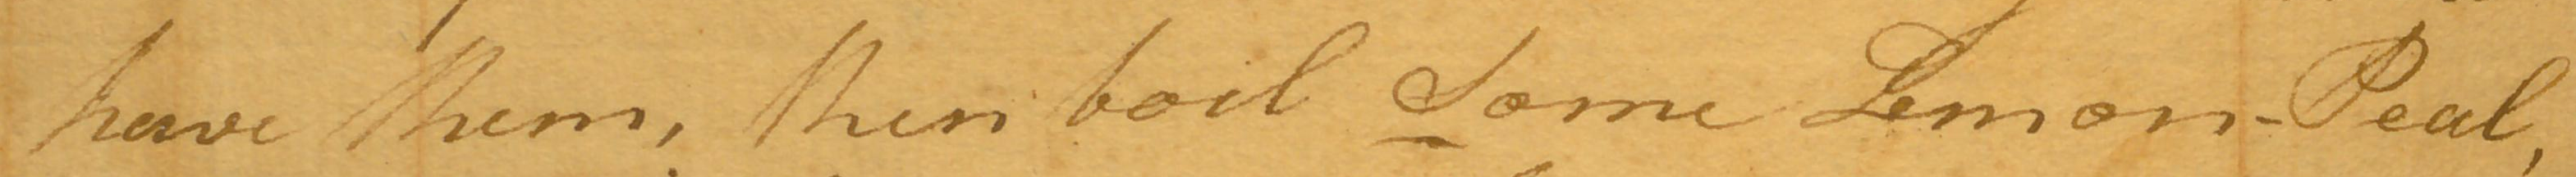have them, then boil some Lemon-Peal,
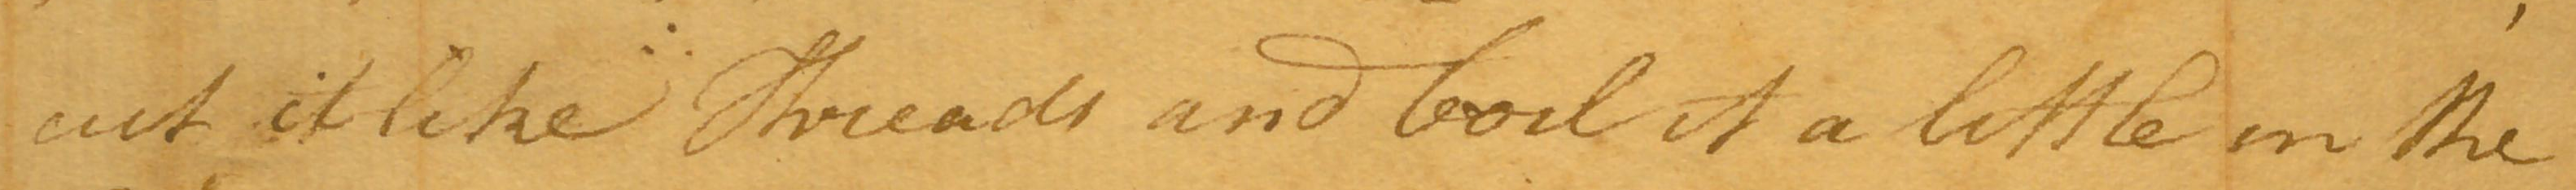cut it like Threads and boil it a little in the
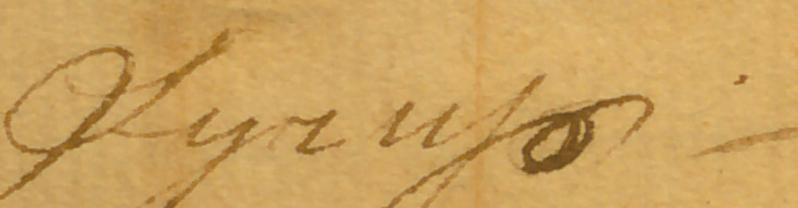Syrup
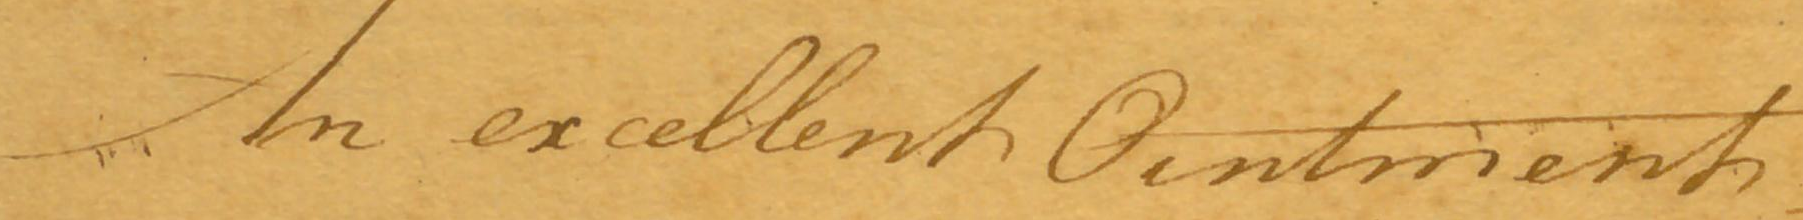An excellent Ointment
